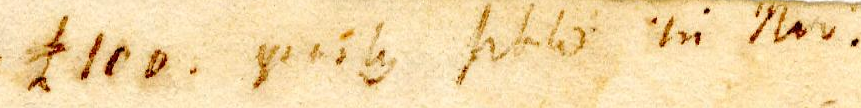£100. yearly pbler in nor.
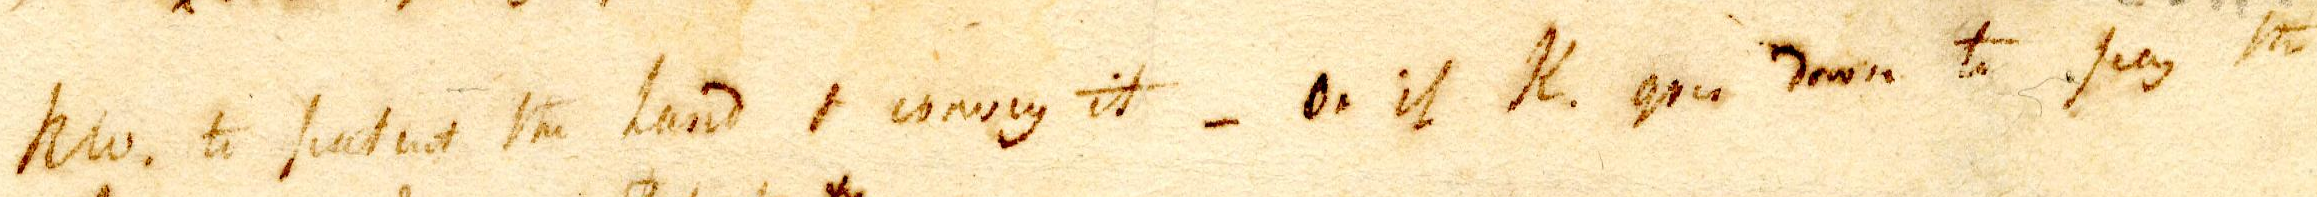RW. to patent the Land & convey it- or if K. goes down to pay its
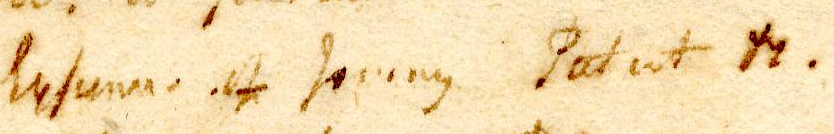Expenses of Journey Patent or.
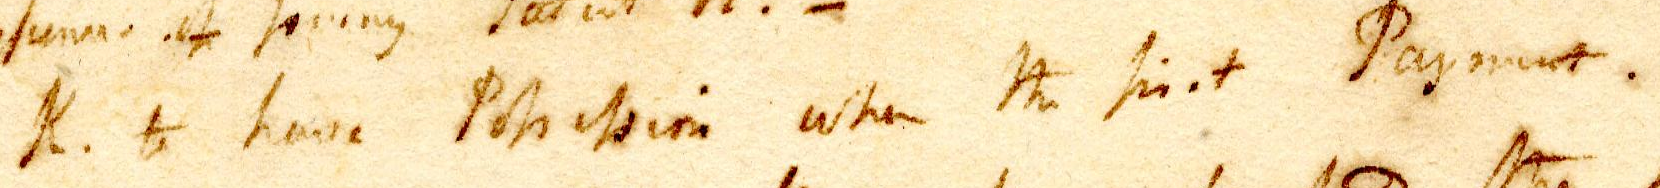K. to have Possession when the first Payment.
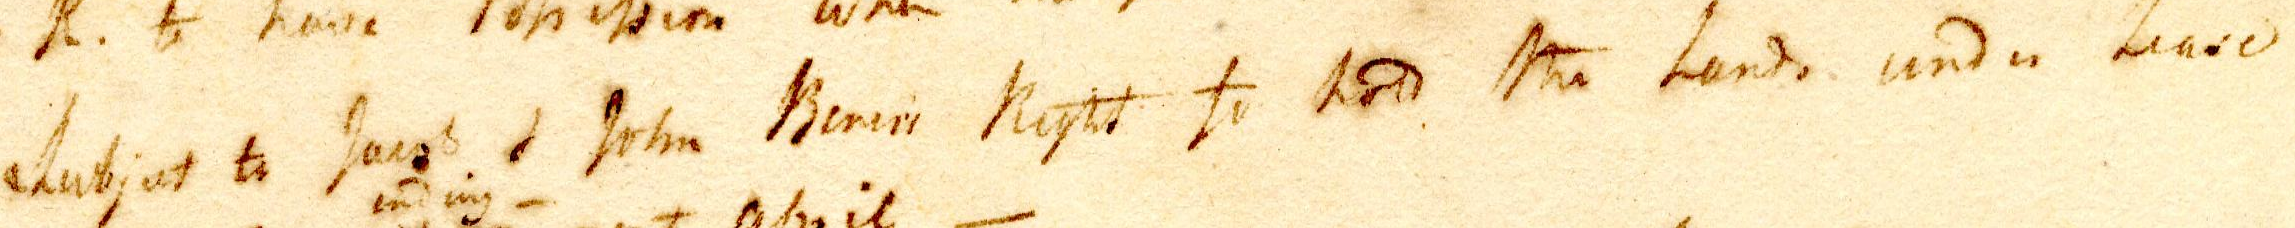-Subject to Jacob & John Bern Right to hold the Lands under Lease
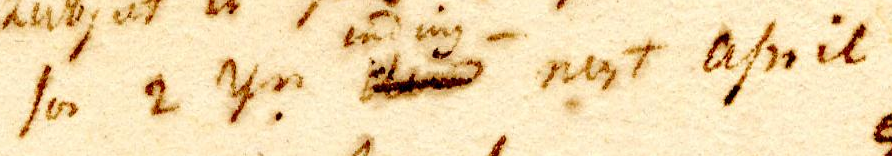for 2 y^rs. during next april
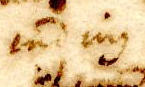ending
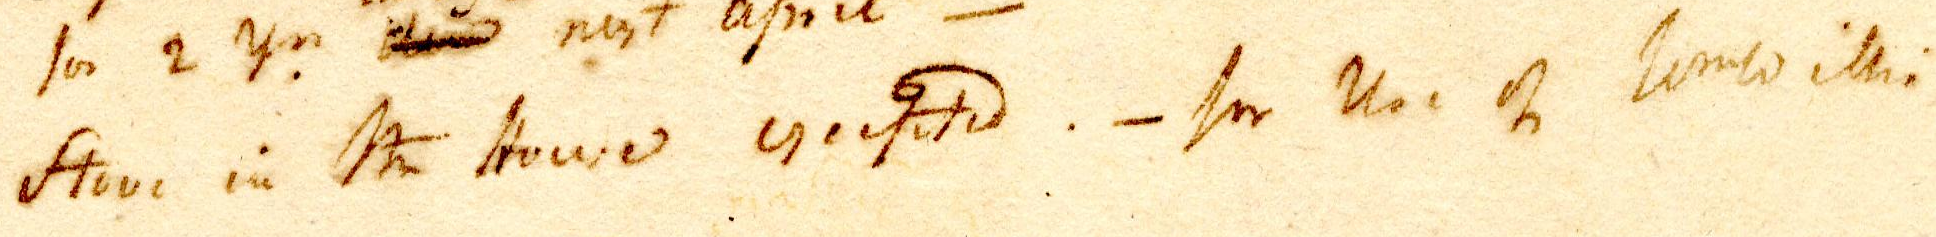Stove in the House excepted - for Use of W^m Wilson
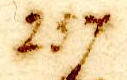257
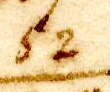52
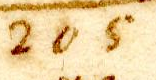205
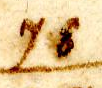78
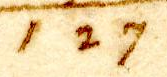127
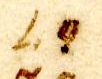49
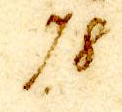78
